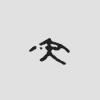內
